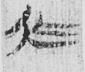於
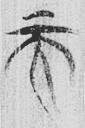天
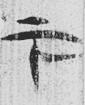下
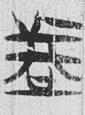者
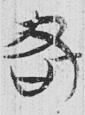各
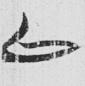㠯（以）
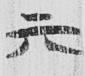亓
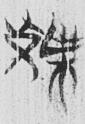○（世）
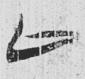㠯（以）
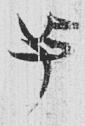及
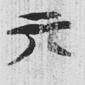亓
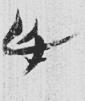身
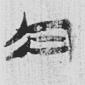今
